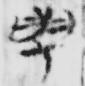受
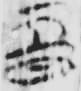○（期）
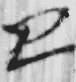巳
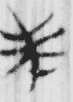未
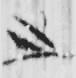之
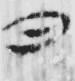日
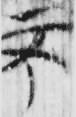不
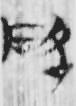阩
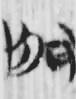門
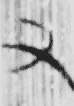又
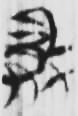敗
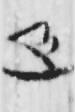疋
